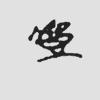䖒
